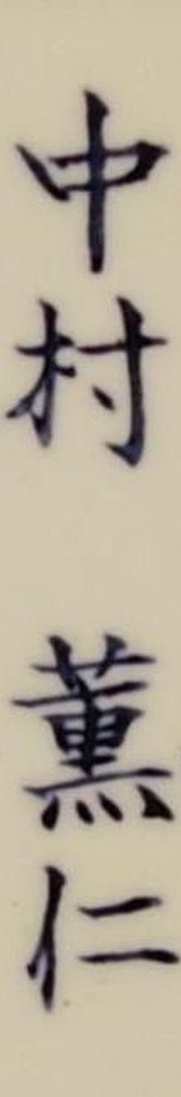中村薫仁
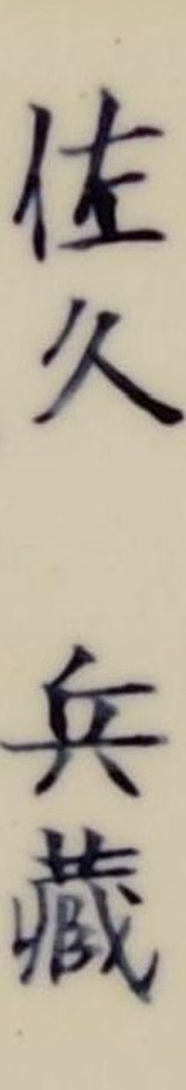佐久兵蔵
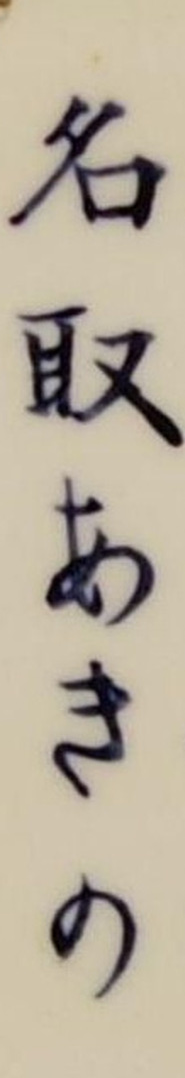名取あきの
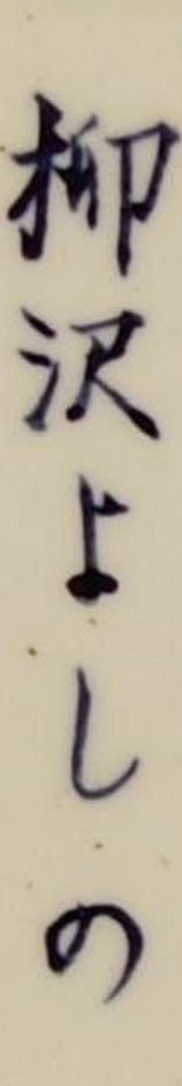柳沢よしの
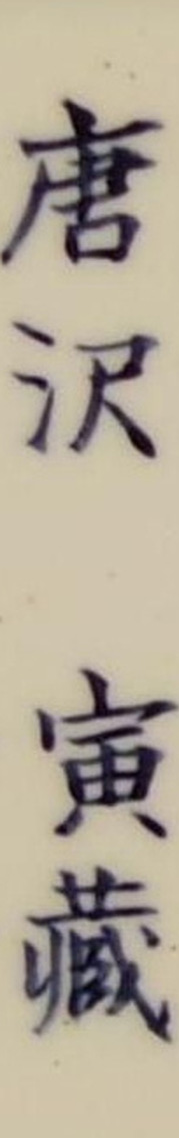唐沢寅蔵
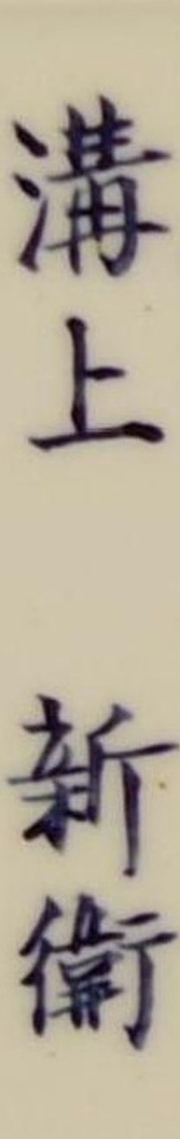溝上新衛
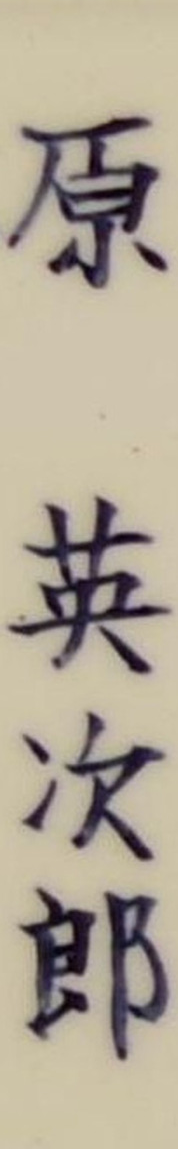原英次郎
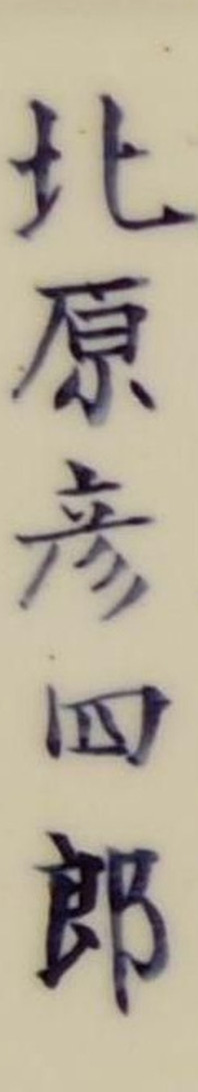北原彦四郎
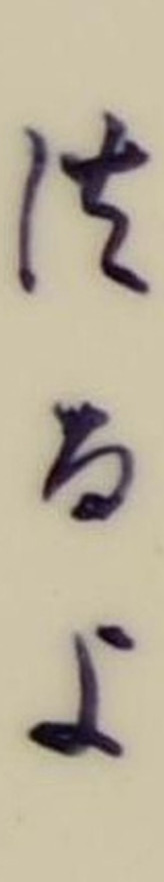つるよ

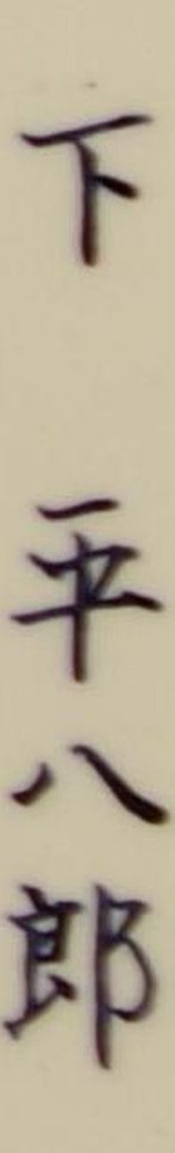下平八郎
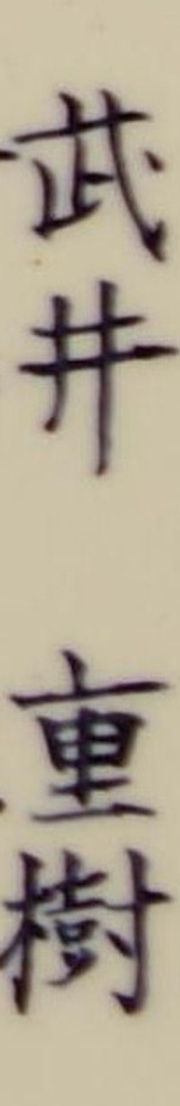武井重樹
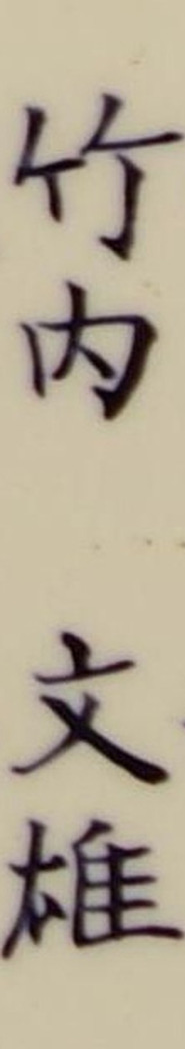竹内文雄
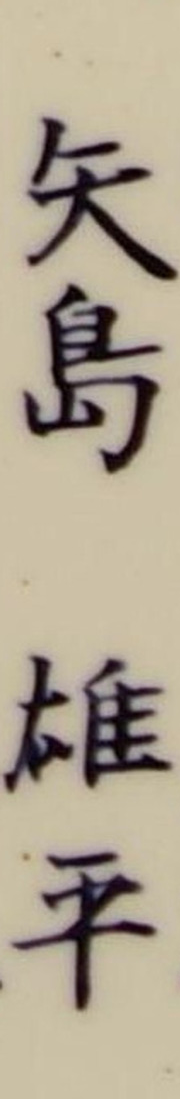矢島雄平
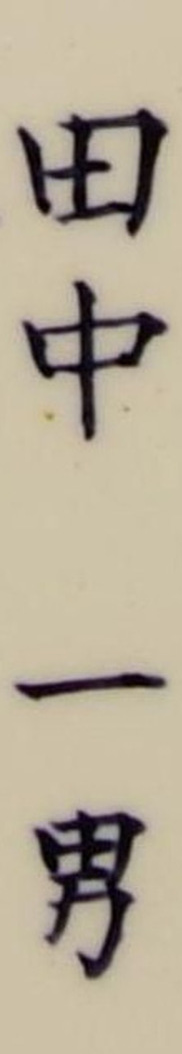田中一男
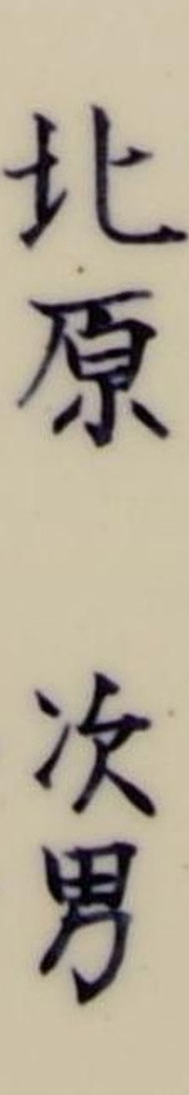北原次男
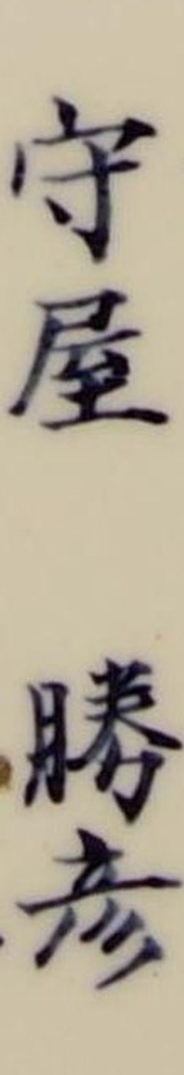守屋勝彦
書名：E~L
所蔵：高野山金剛峯寺
